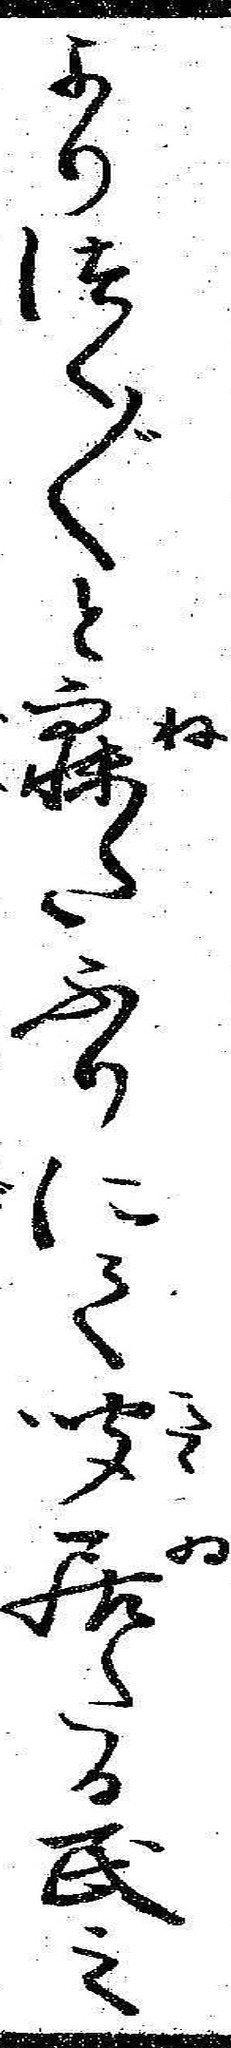よりつく〴〵と寝たふりにて聞居たる民之
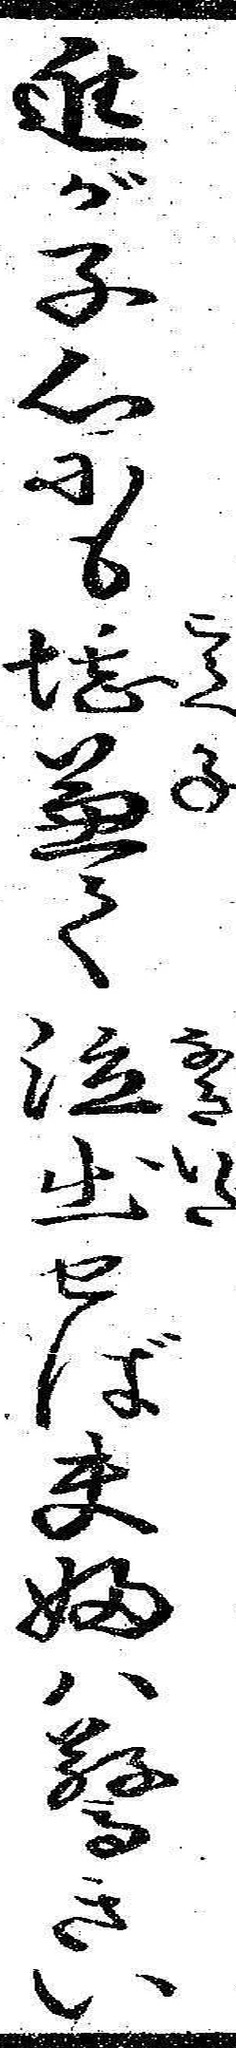進が子心にも堪兼て泣出せば夫婦は驚きい
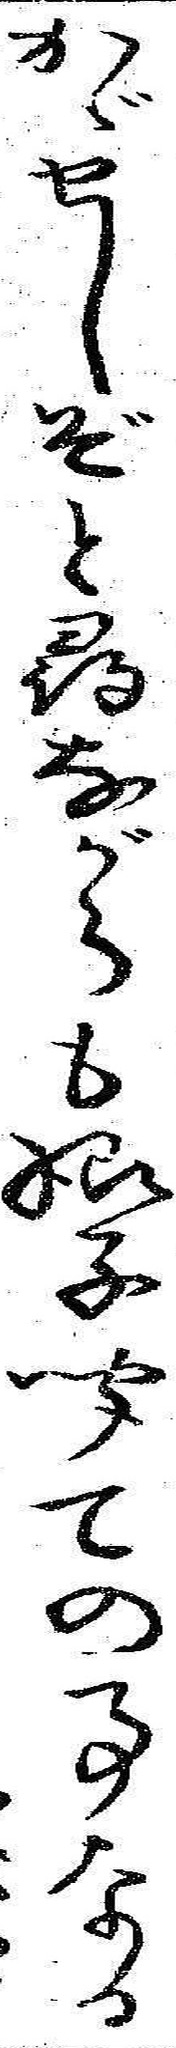かゞせしぞと尋ながらも様子聞ての事なる
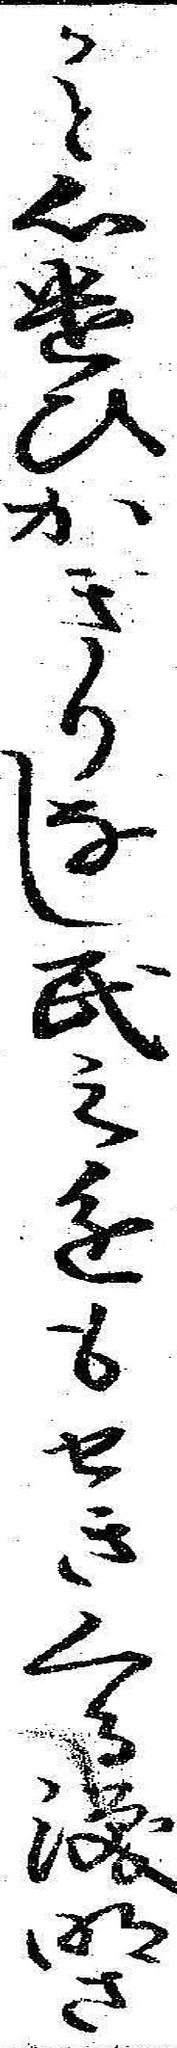かと心遣ひかきりなし民之進もせきくる涙明さ
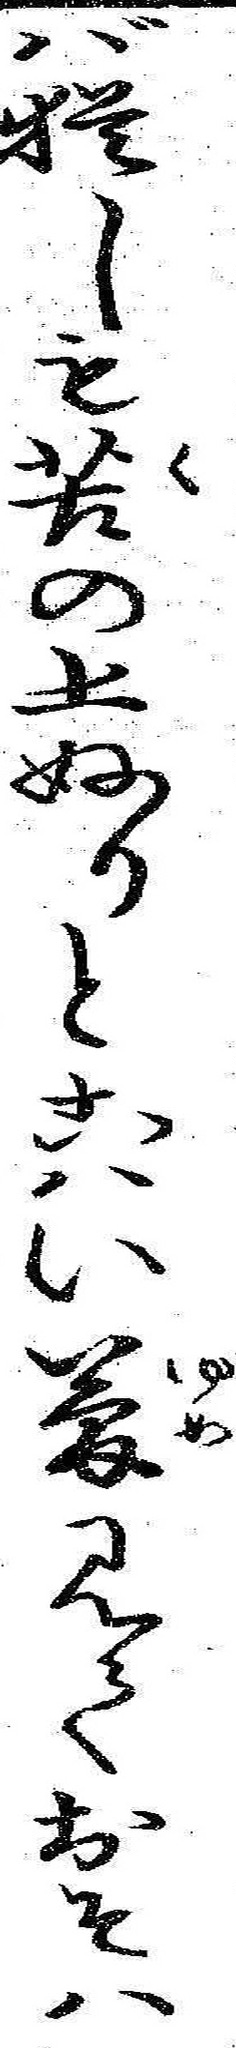ば猶しも苦の上ぬりとこはい夢見ておそは
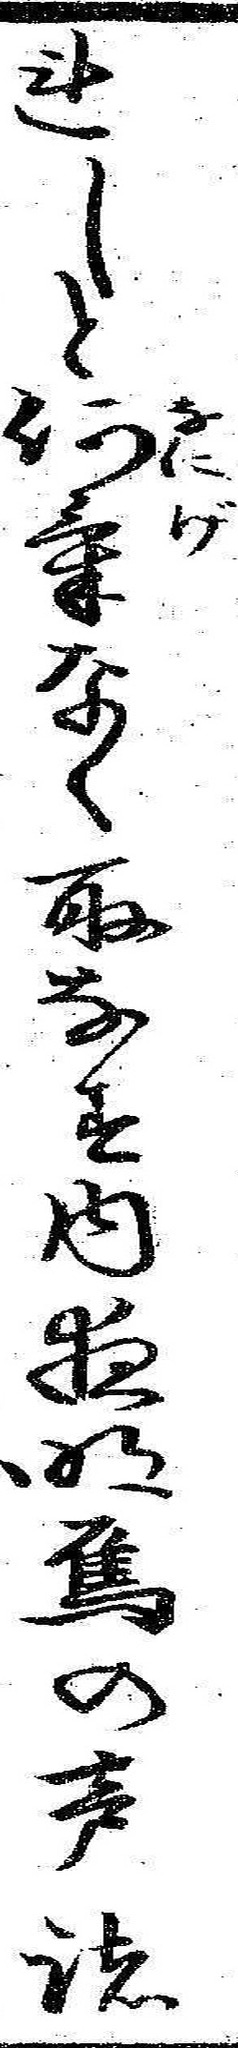れしと何気なく取なす内夜明烏の声諸
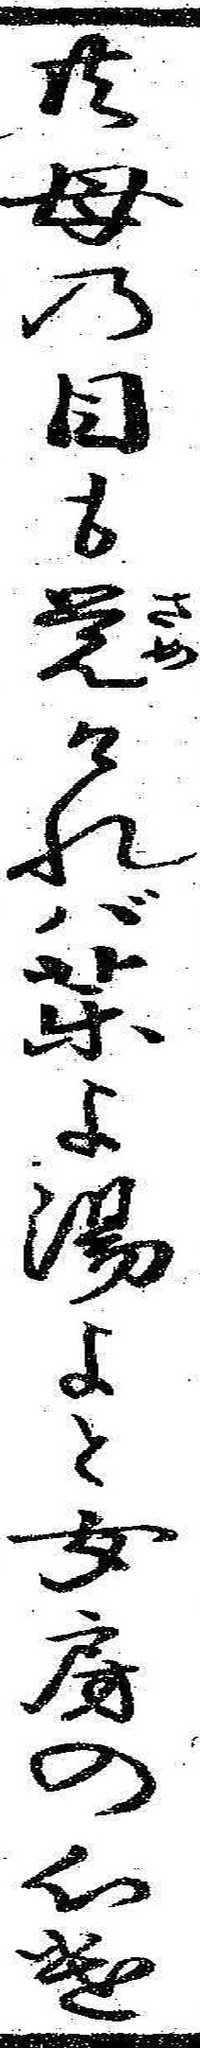共母の目も覚ければ薬よ湯よと女房の心遣
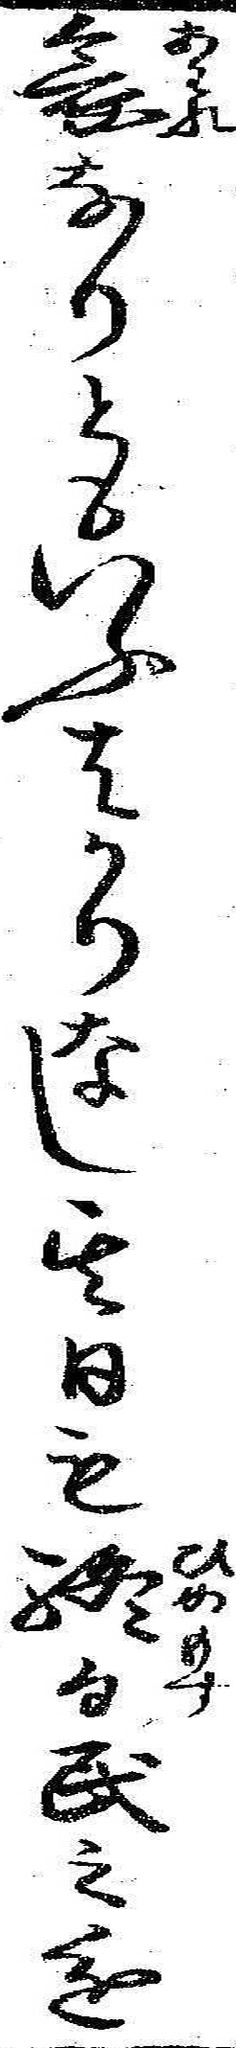哀なりともいふはかりなし其日も終日民之進
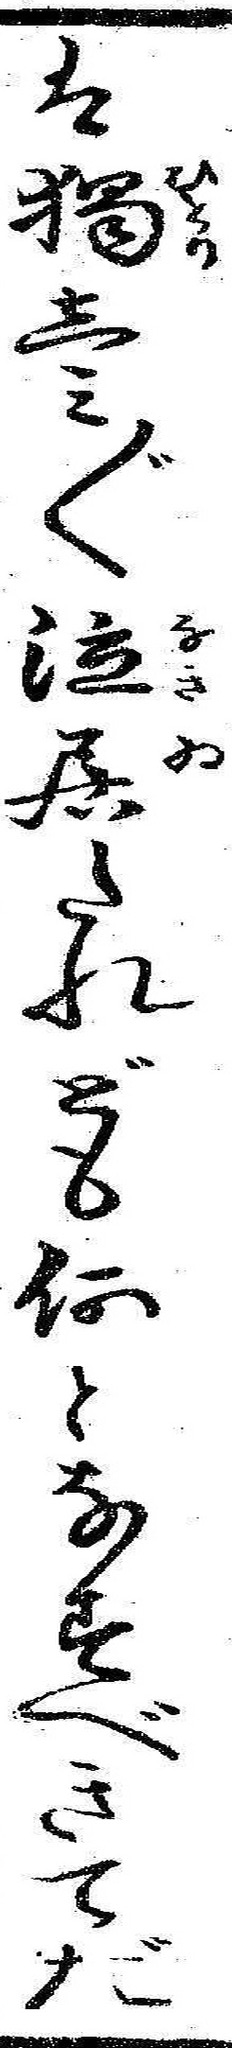は独しみ〴〵泣居たれども何となすべきてだ
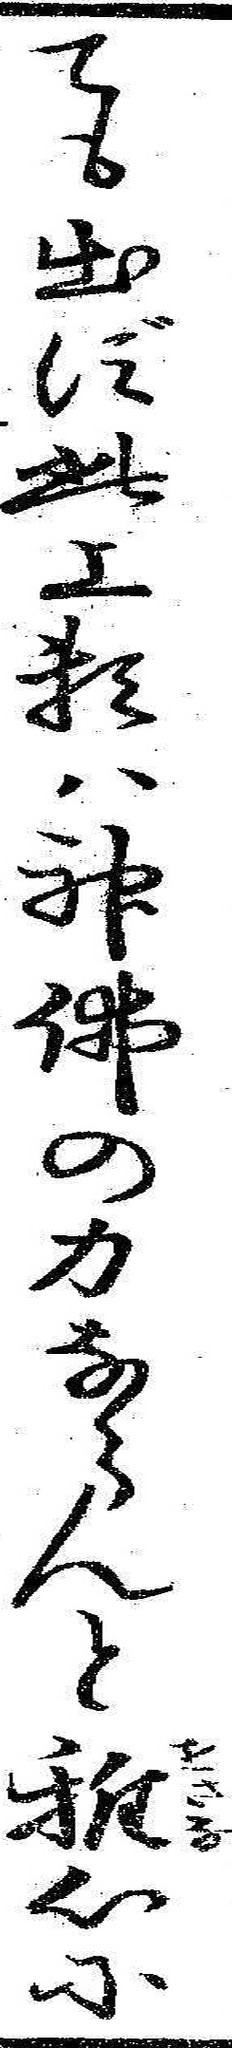ても出ず此上頼は神仏の力ならんと稚心に
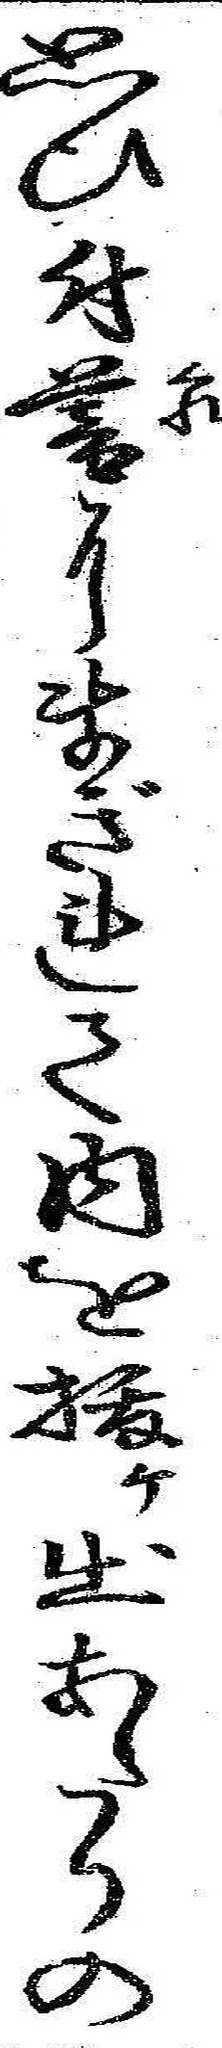思ひ付暮にまぎれて内を抜出あたりの
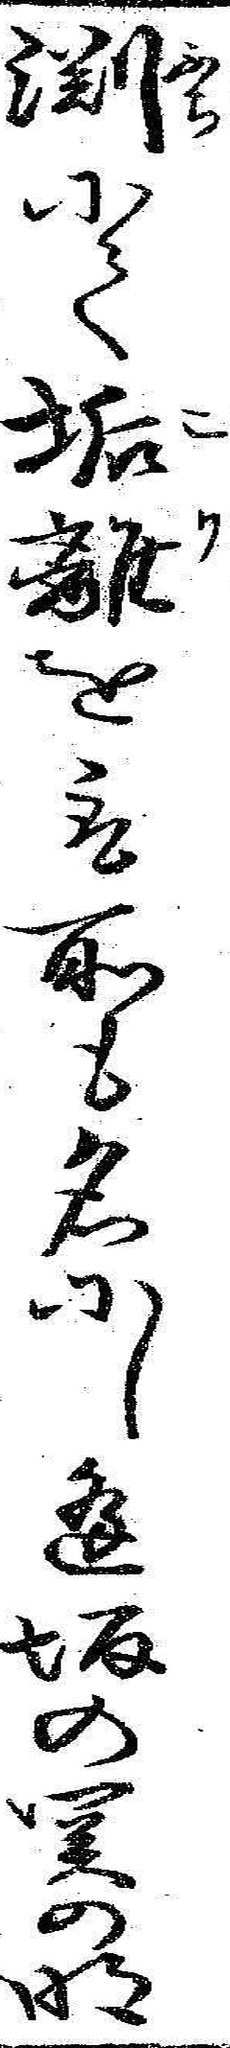淵にて垢離を取所も名にし逢坂の関の明
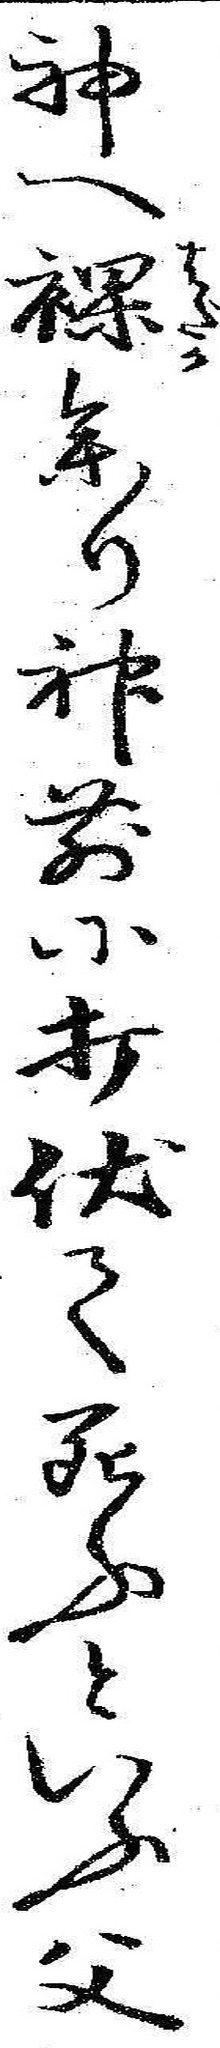神へ裸参り神前に打伏て死ふといふ父
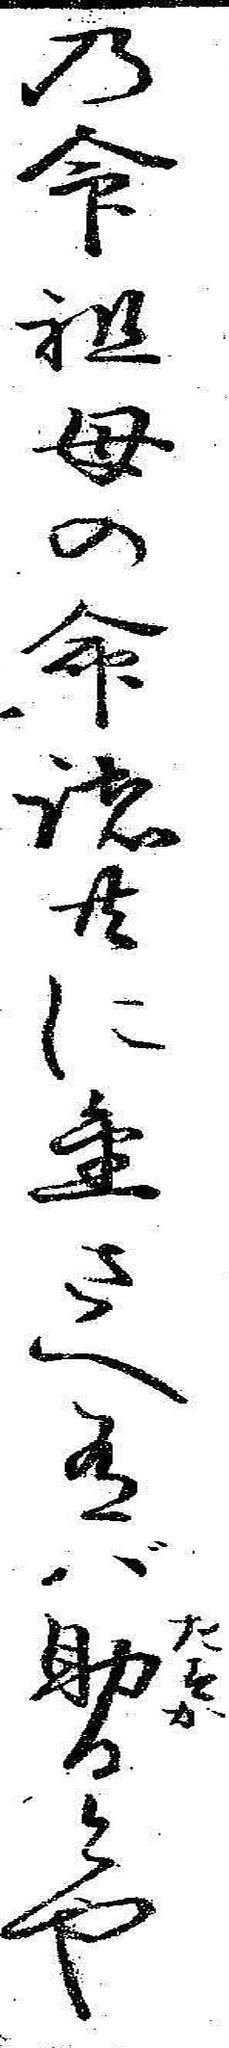の命祖母の命諸共に金さへ有ば助るとや
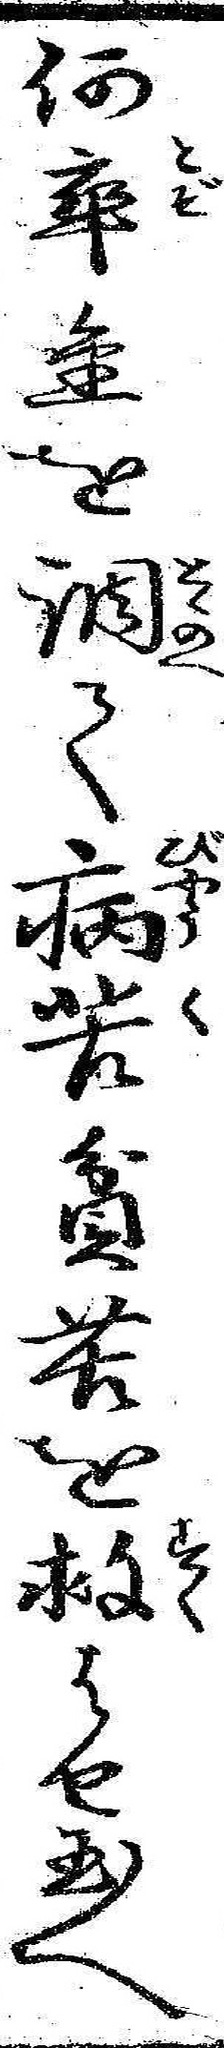何卒金を調て病苦貧苦を救はせ玉へ
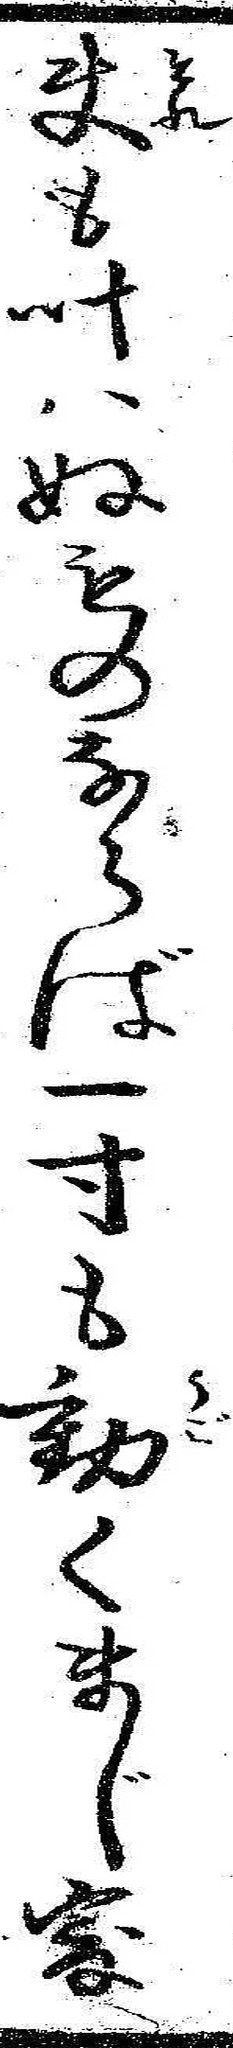夫も叶はぬものならば一寸も動くまじ爰
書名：根無草後編
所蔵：国文学研究資料館
